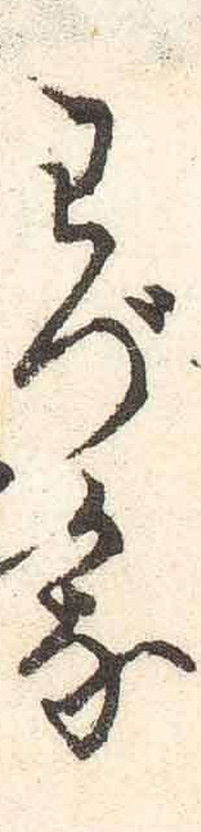わづかな
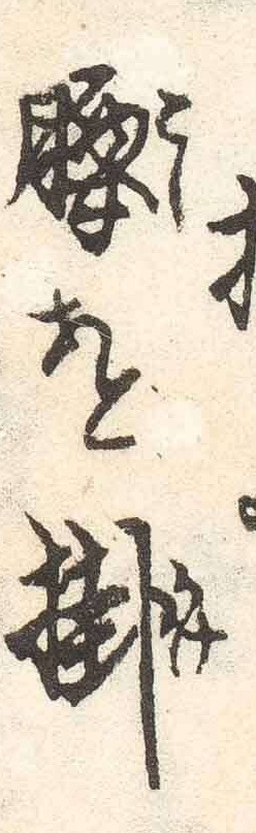腰を掛
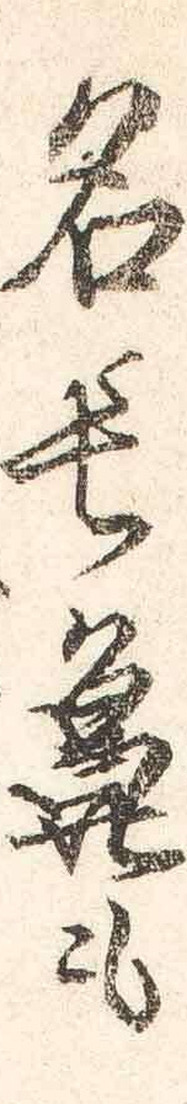名も鼻も
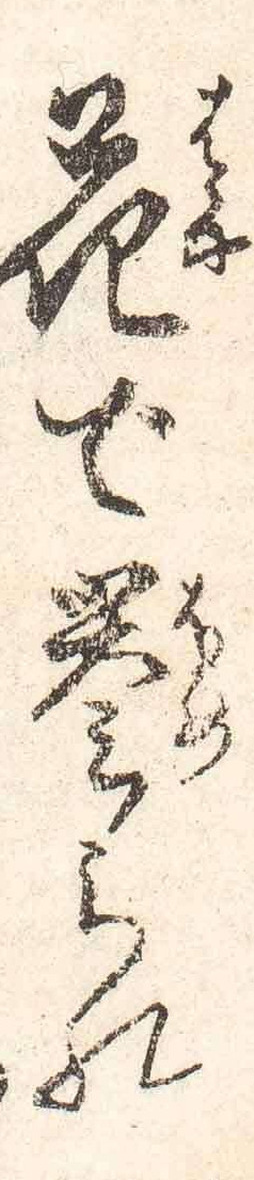花で誉られ
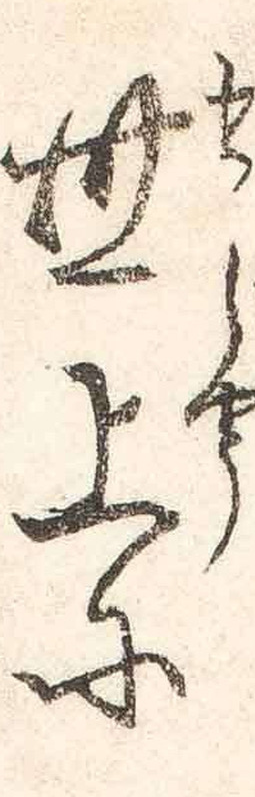世上に
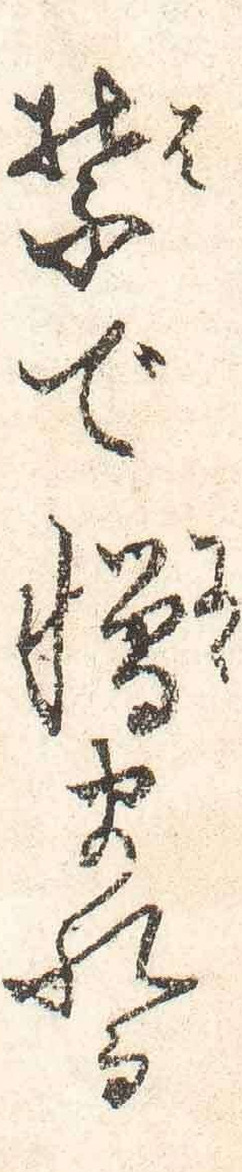葉で憎まれる

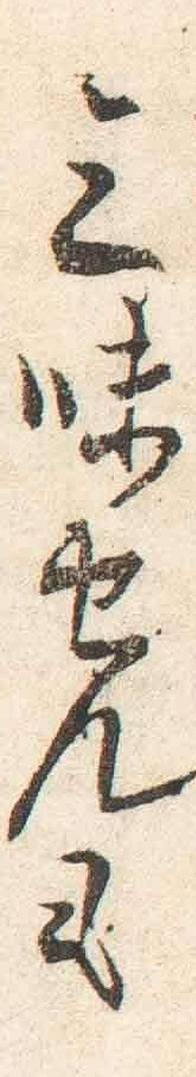三味せんも
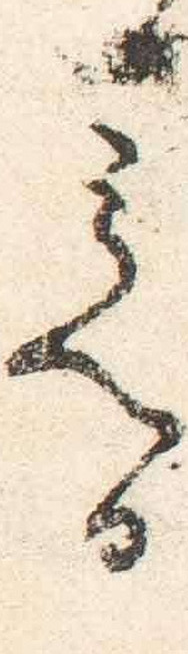みへる
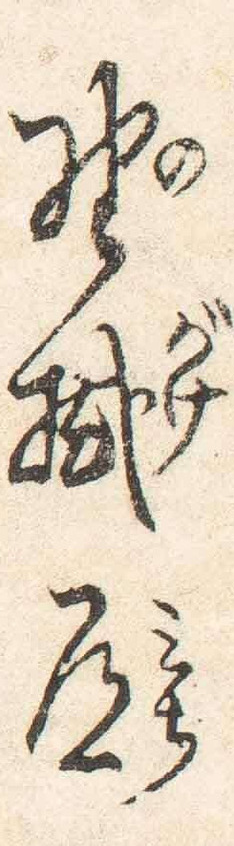野掛道
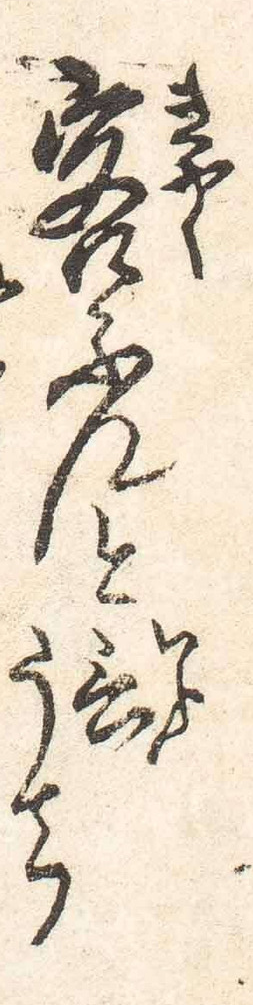客ふんと言
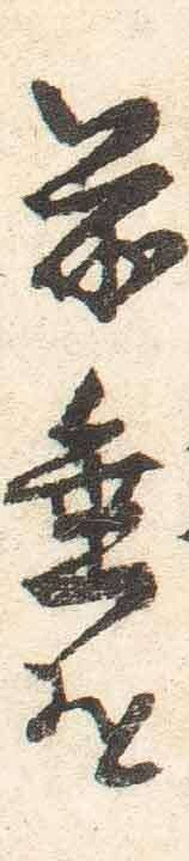前垂を
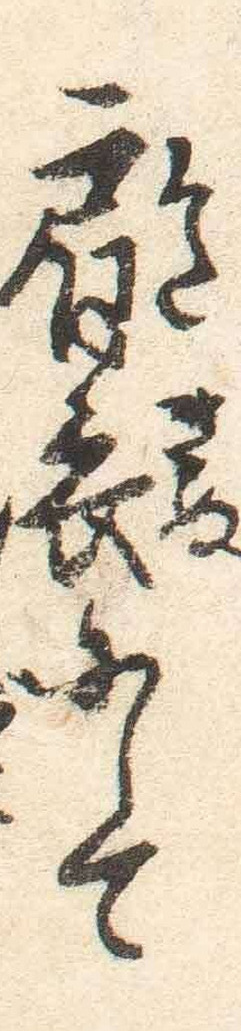肩衣にして
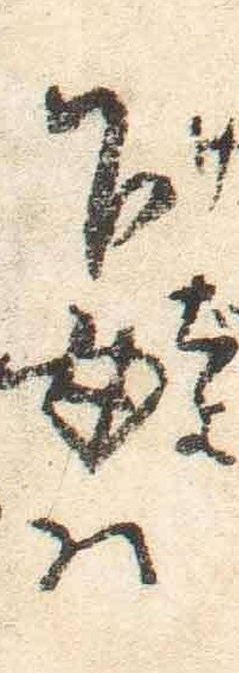下女は
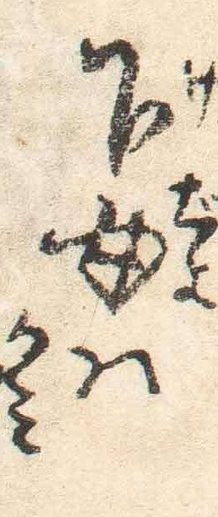下女は
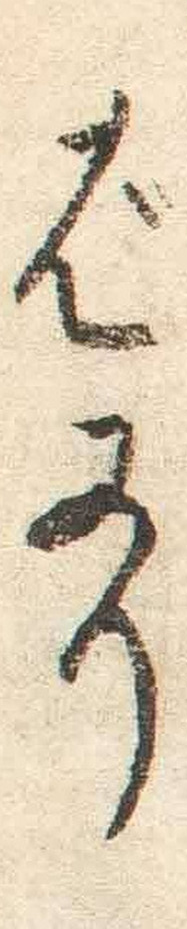ばかり

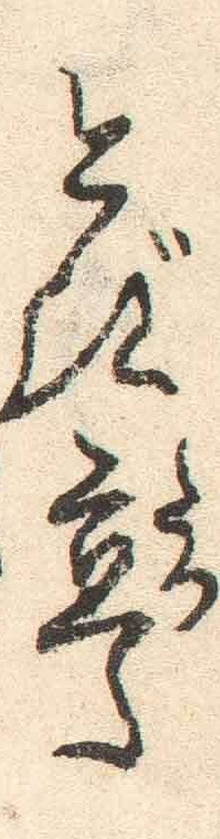とぎ立た
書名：画本柳樽
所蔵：東京学芸大学附属図書館 国文学研究資料館
